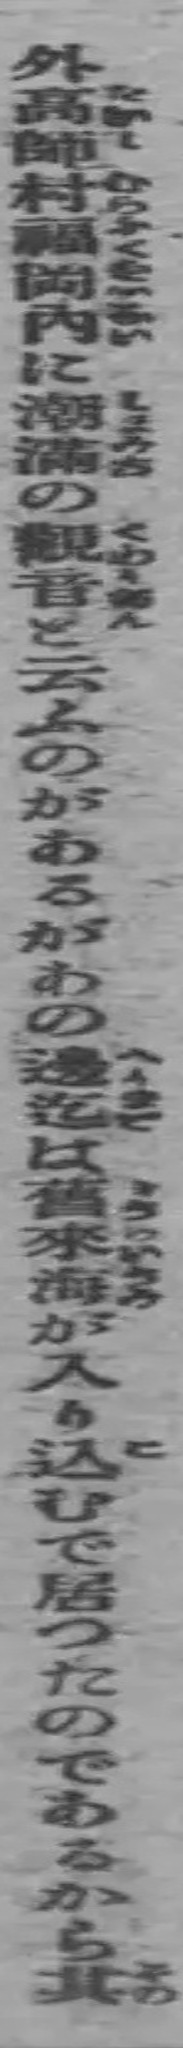外高師村福岡内に潮満の観音と云ふのがあるがあの辺迄は旧来海が入り込むで居つたのであるから其
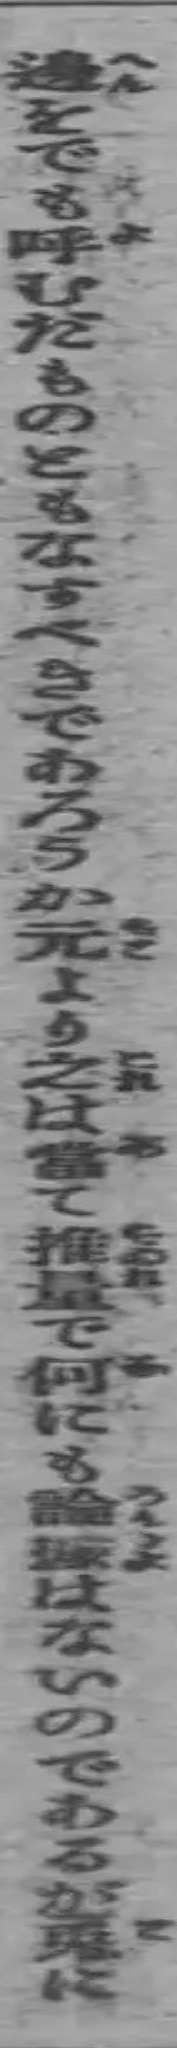辺をでも呼むだものともなすべきであろうか元より之は当て推量で何にも論拠はないのであるが兎に

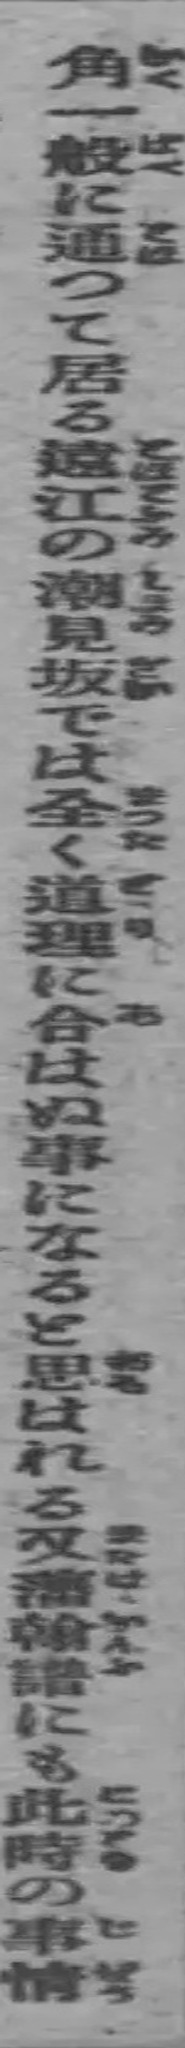角一般に通つて居る遠江の潮見坂では全く道理に合はぬ事になると思はれる又藩翰譜にも此時の事情
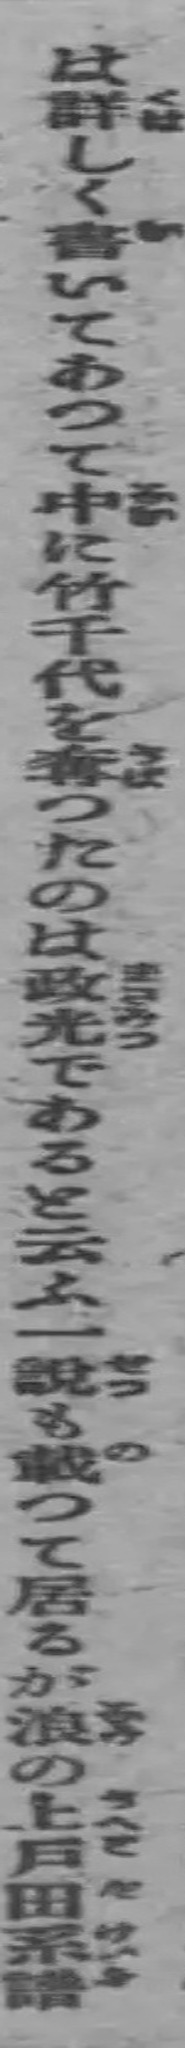は詳しく書いてあつて中に竹千代を奪つたのは政光であると云ふ一説も載つて居るが浪の上戸田系譜
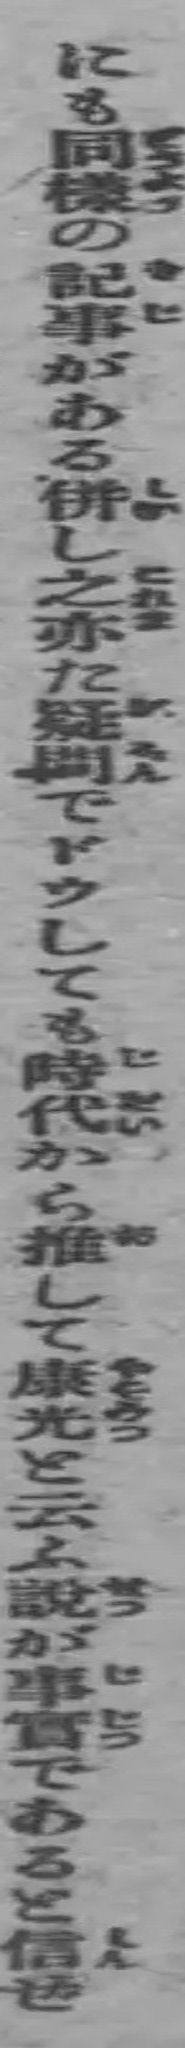にも同様の記事がある併し之亦た疑問でドウしても時代から推して康光と云ふ説が事実であると信ぜ
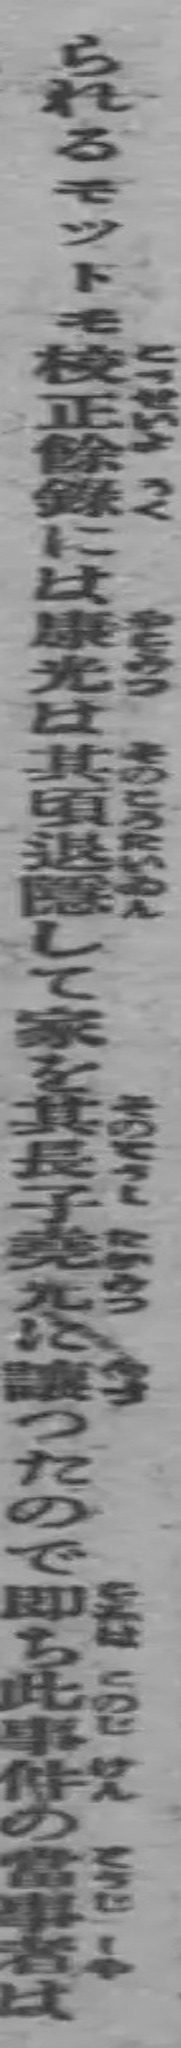戸田尭光られるモツトモ校正余録には康光は其頃退隠して家を其長子尭光に譲つたので即ち此事件の当事者は
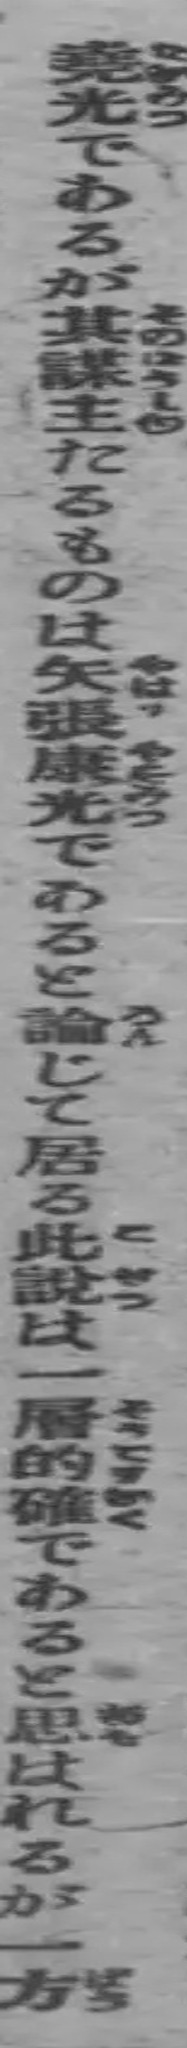尭光であるが其謀主たるものは矢張康光であると論じて居る此説は一層的確であると思はれるが一方
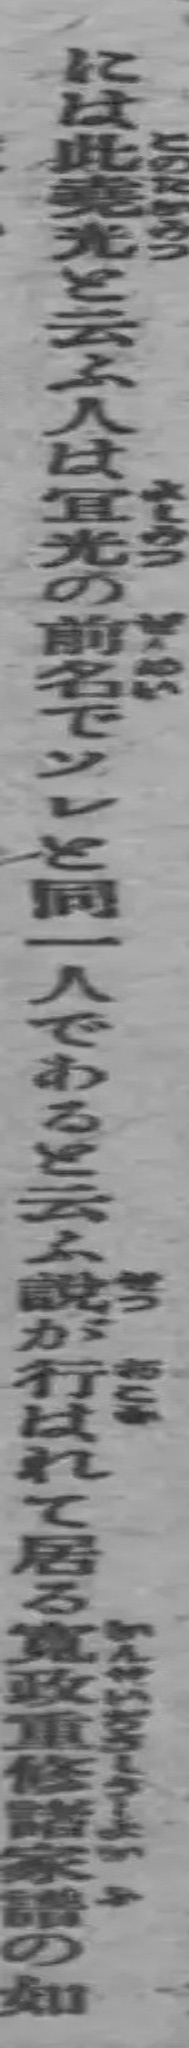には此尭光と云ふ人は冝光の前名でソレと同一人であると云ふ説が行はれて居る寛政重修諸家譜の如
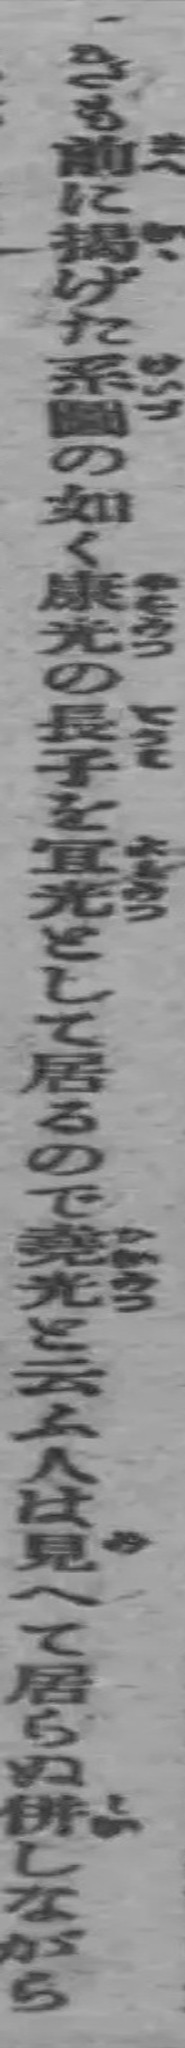きも前に掲げた系図の如く康光の長子を冝光として居るので尭光と云ふ人は見へて居らぬ併しながら
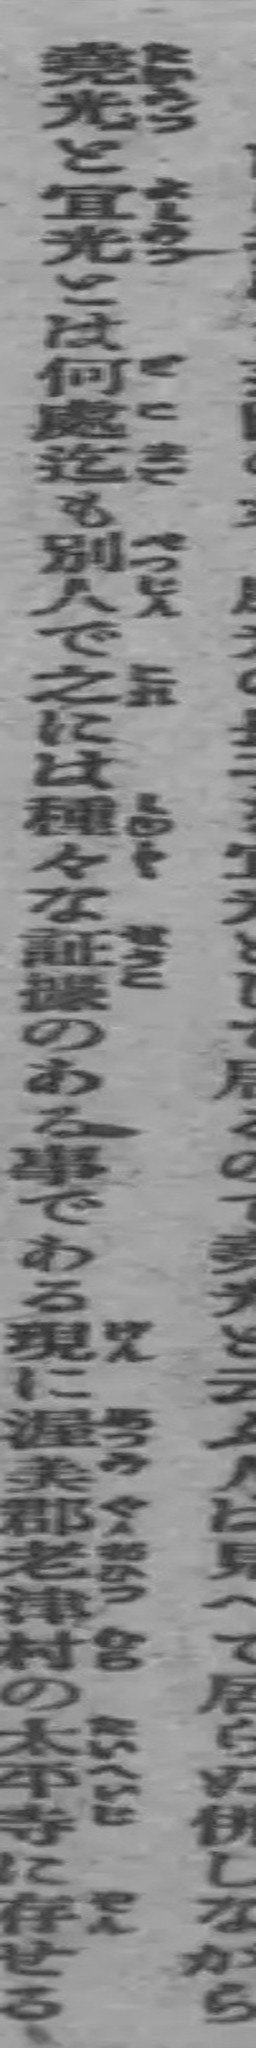尭光と冝光とは何処迄も別人で之には種々な証拠のある事である現に渥美郡老津村の太平寺に存せる
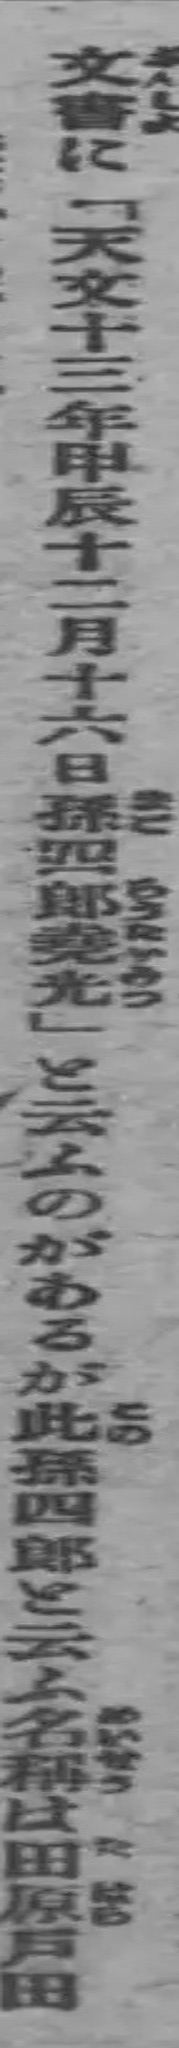文書に「天文十三年甲辰十二月十六日孫四郎尭光」と云ふのがあるが此孫四郎と云ふ名称は田原戸田
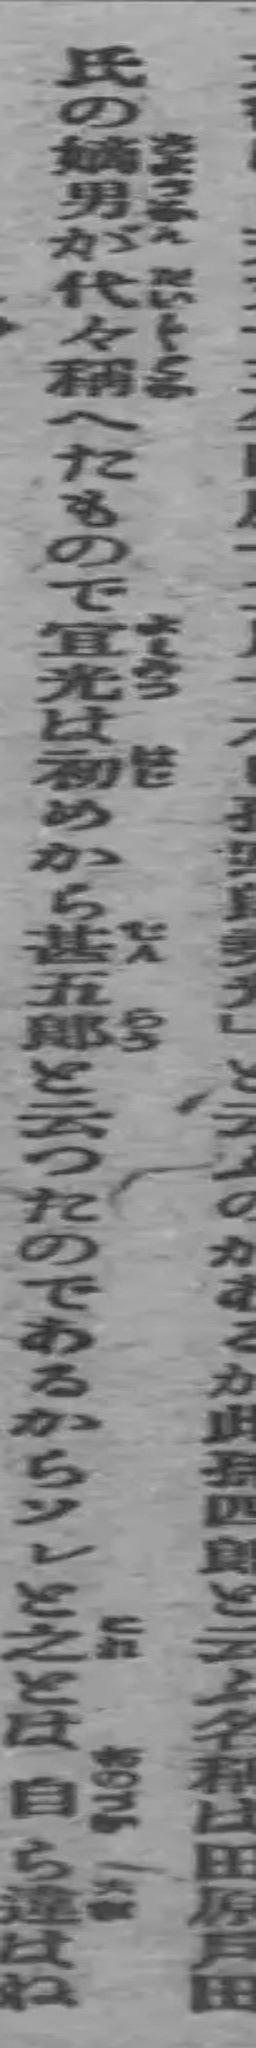氏の嫡男が代々称へたもので冝光は初めから甚五郎と云つたのであるからソレと之とは自ら違はね
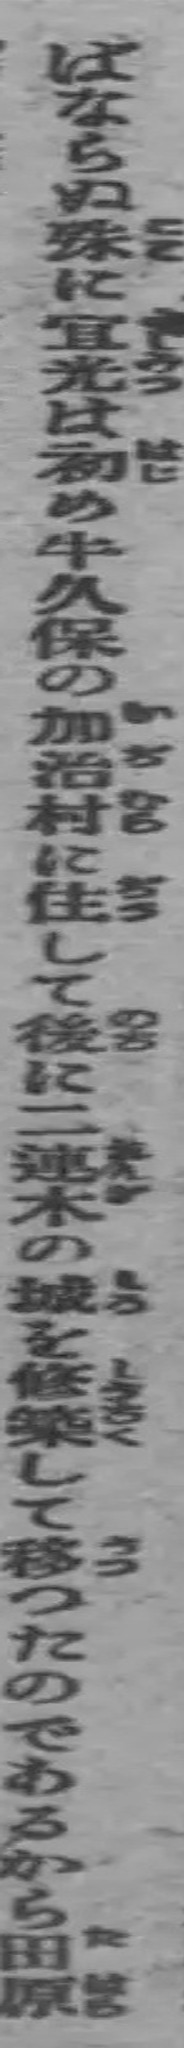ばならぬ殊に冝光は初め牛久保の加治村に住して後に二連木の城を修築して移つたのであるから田原
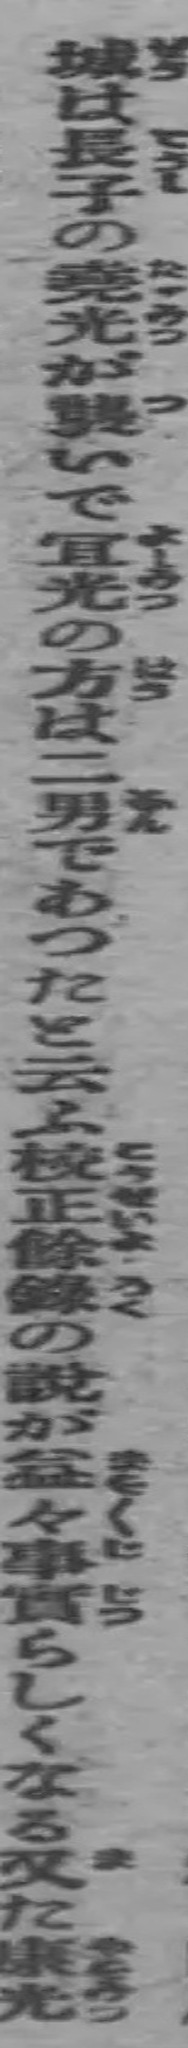城は長子の尭光が襲いで冝光の方は二男であつたと云ふ校正余録の説が益々事実らしくなる又た康光
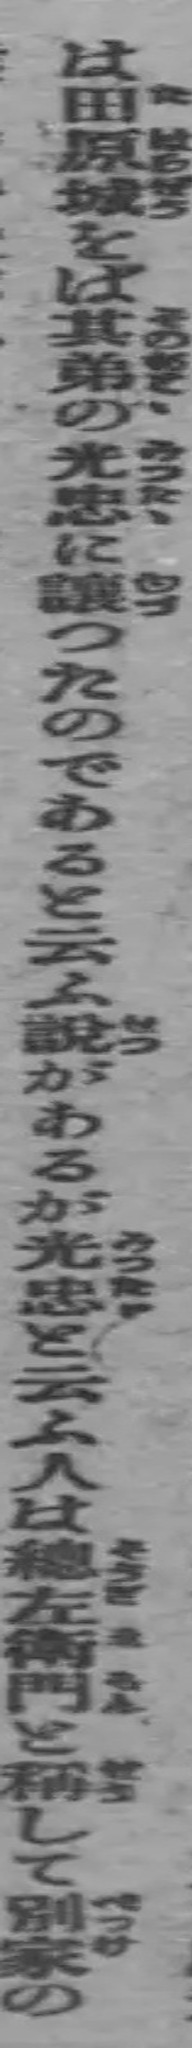は田原城をば其弟の光忠に譲つたのであると云ふ説があるが光忠と云ふ人は総左衛門と称して別家の
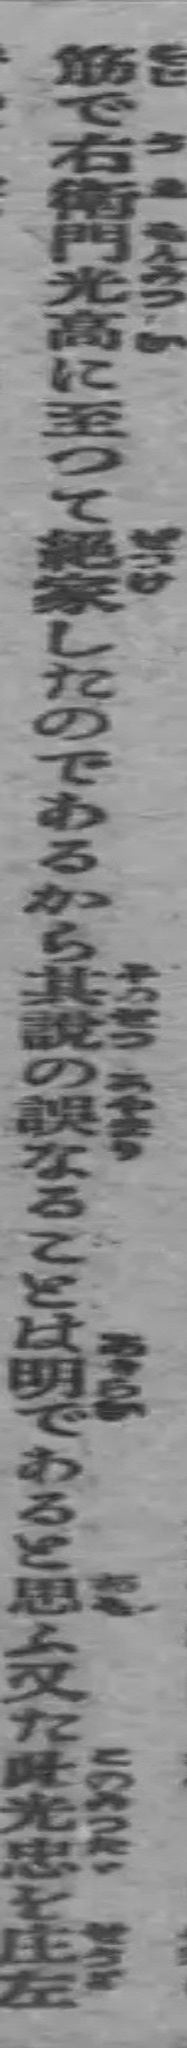筋で右衛門光高に至つて絶家したのであるから其説の誤なることは明であると思ふ又た此光忠を庄左
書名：豊橋市史談
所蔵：国立国会図書館 National Diet Library, JAPAN
